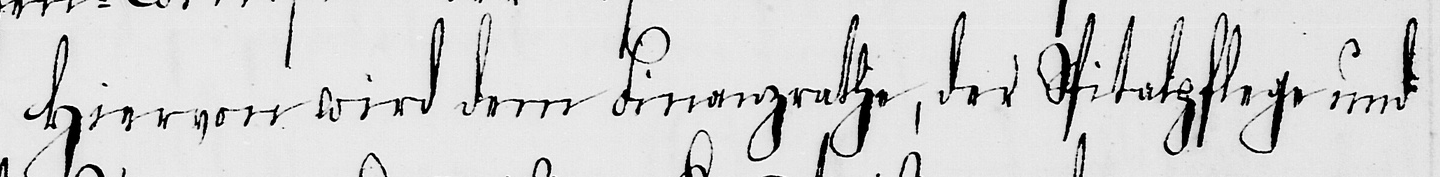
Hiervon wird dem Finanzrathe, der Spitalpflege und
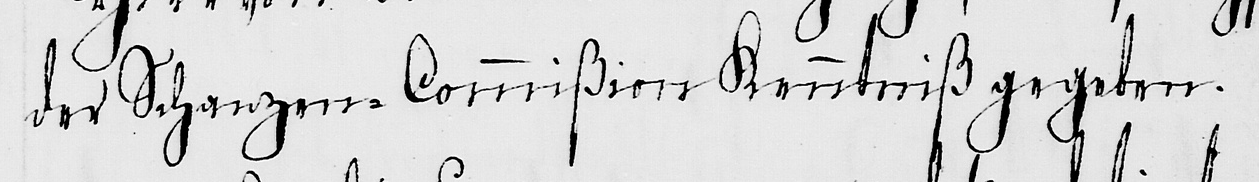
der Schanzen-Commißion Kenntniß gegeben.
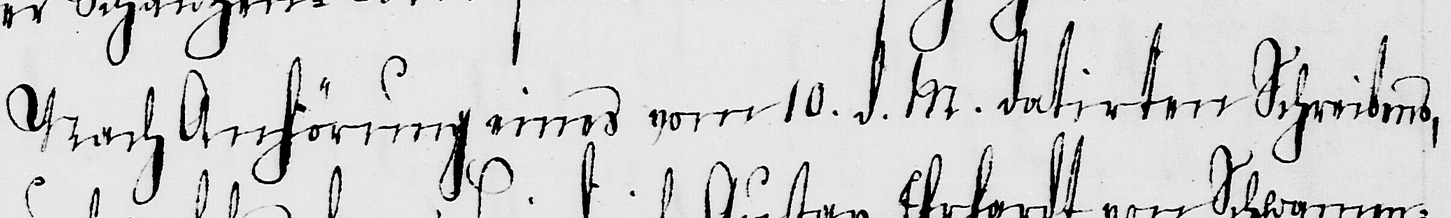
Nach Anhörung eines vom 10. d. M. datirten Schreibens,
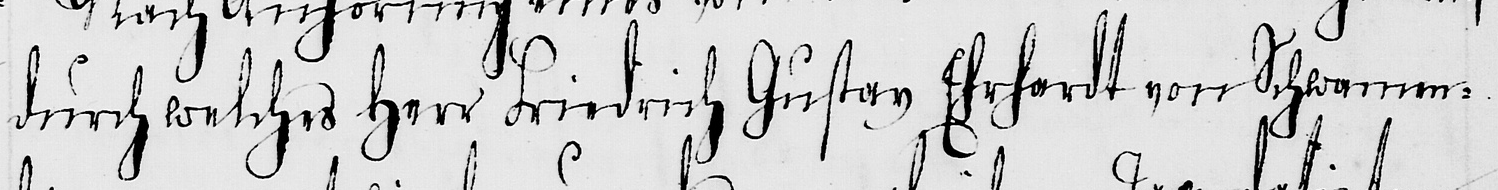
durch welches Herr Friedrich Gustav Ehrhardt von Schwamen¬
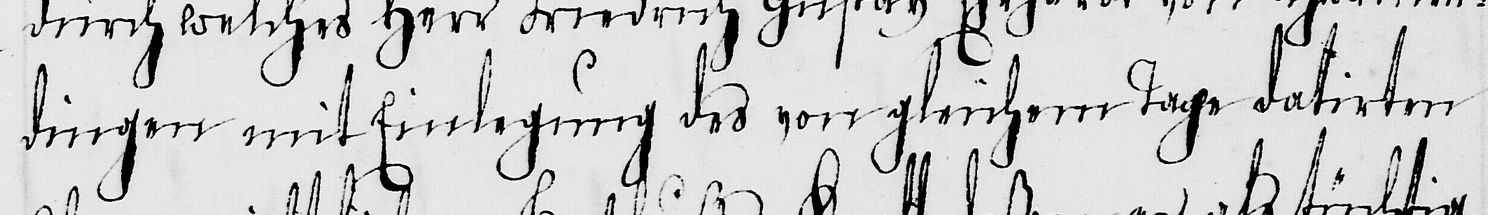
dingen mit Einladung des von gleichem Tage datirten
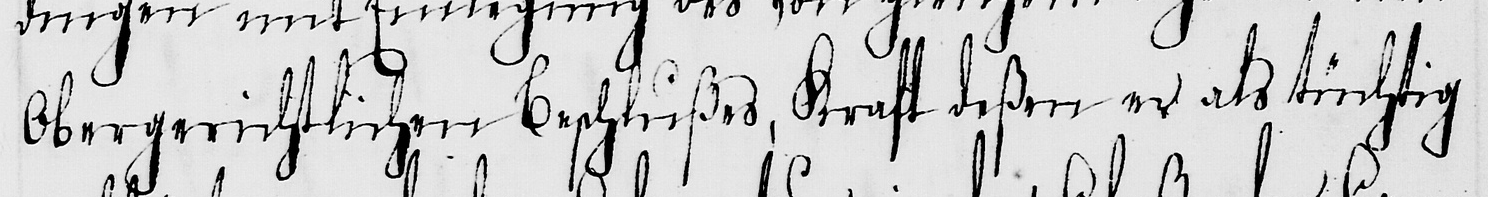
Obergerichtlichen Beschlußes, Kraft deßen er als tüchtig
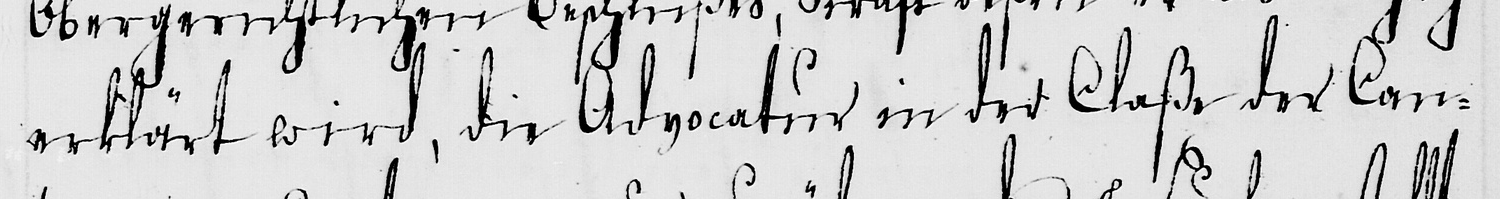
erklärt wird, die Advocatur in der Claße der Can¬
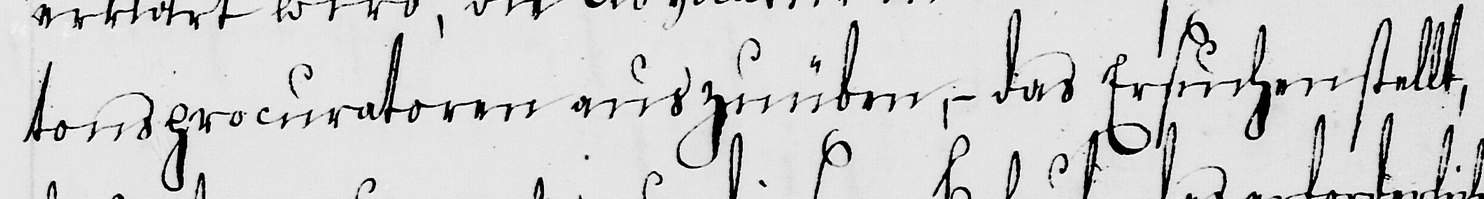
tonsprocuratoren auszuüben, – das Ersuchen stellt,
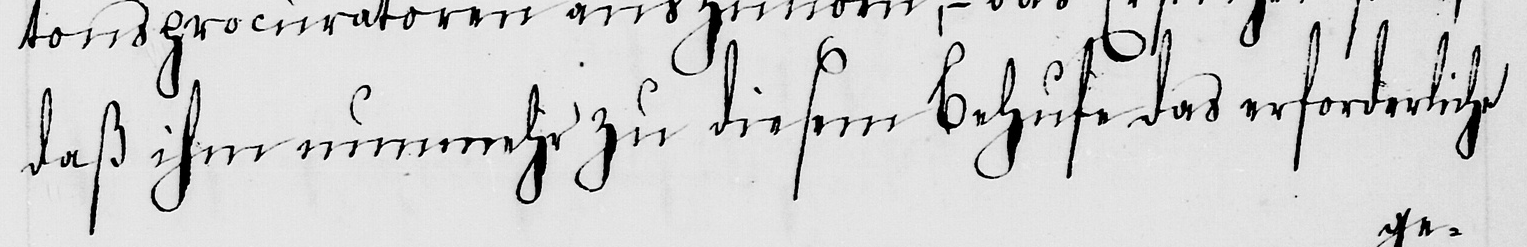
daß ihm nunmehr zu diesem Behufe das erforderlic¬
